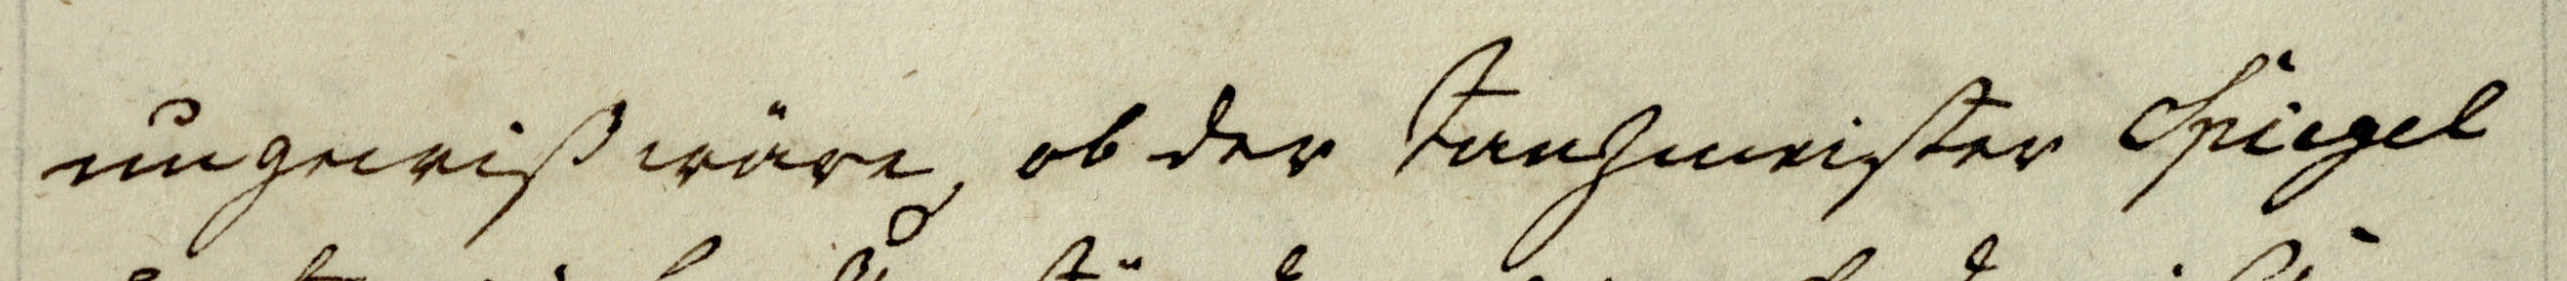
ungewiß wäre, ob der Tanzmeister Spiegel
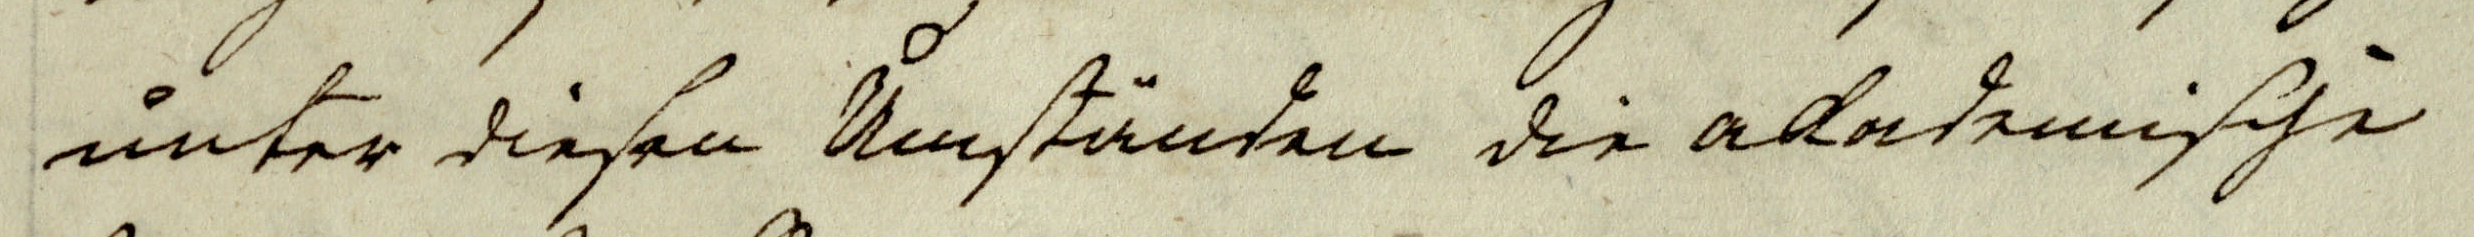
unter diesen Umständen die akademische
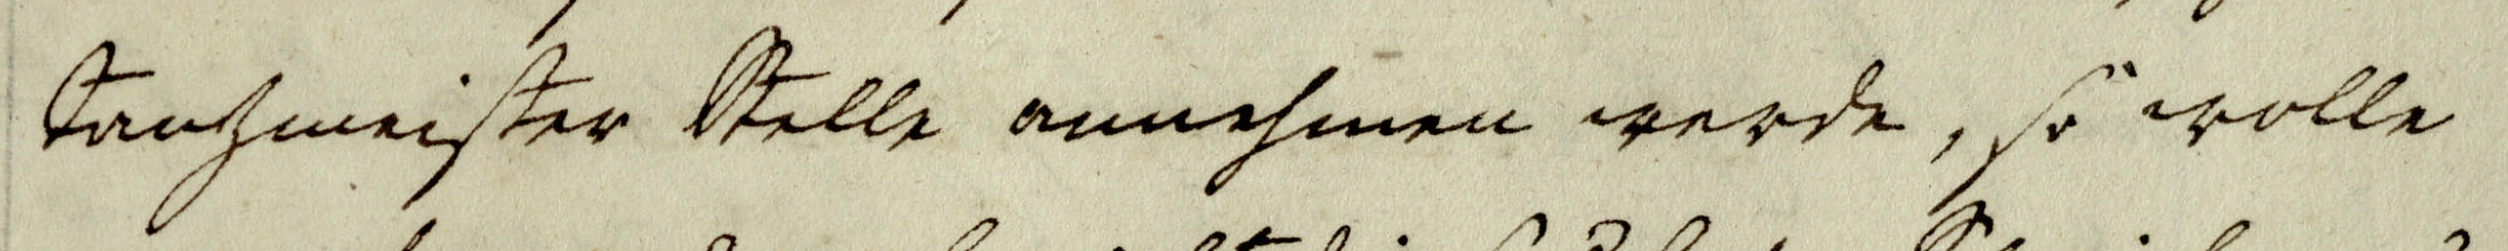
Tanzmeister Stelle annehmen werde, so wolle
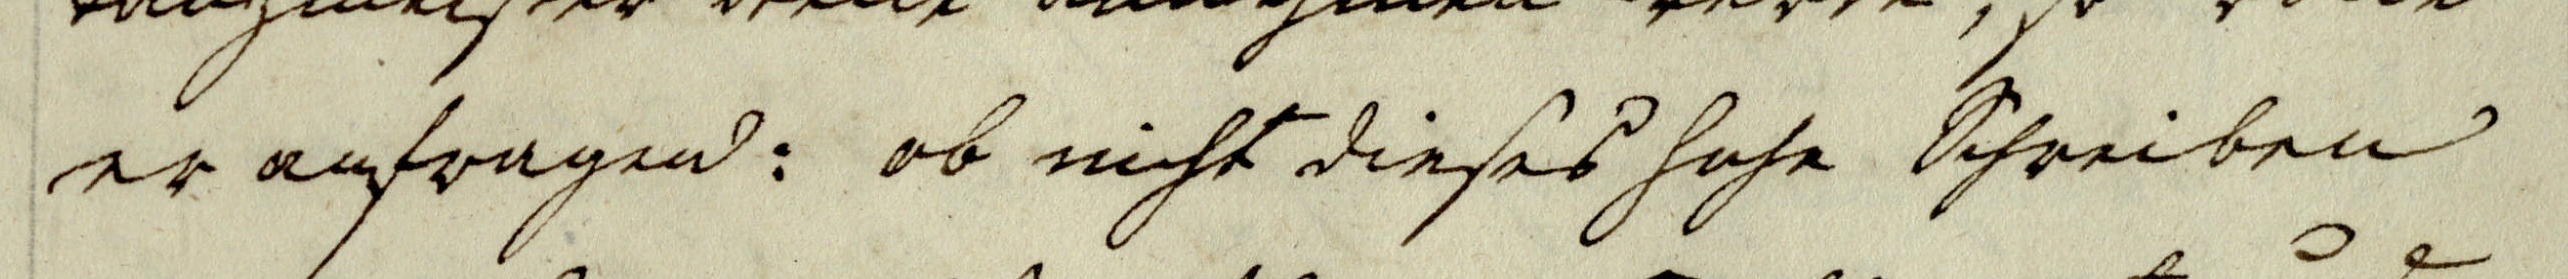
er anfragen: ob nicht dieses hohe Schreiben
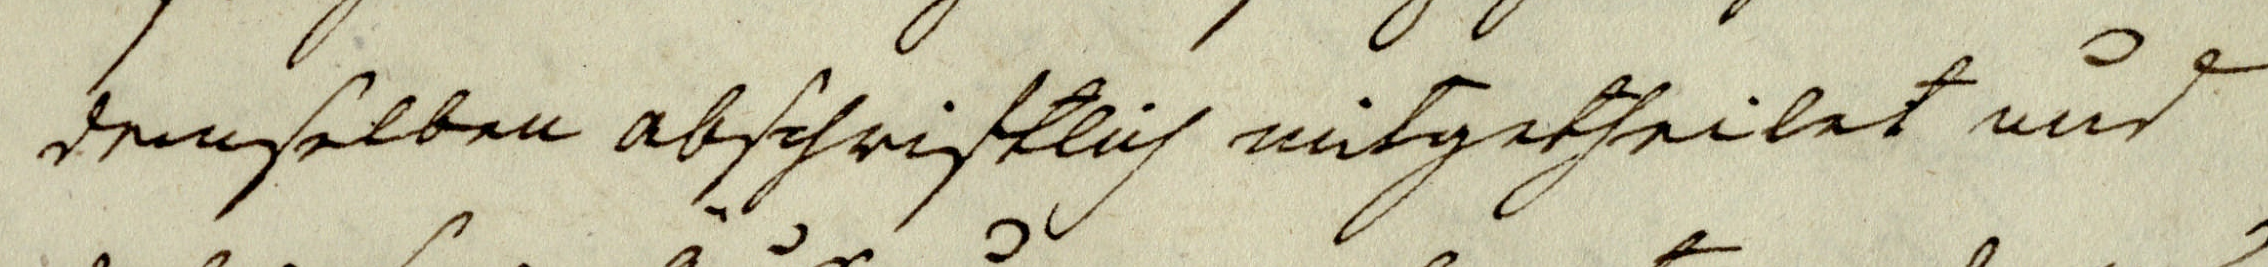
demselben abschriftlich mitgetheilet und
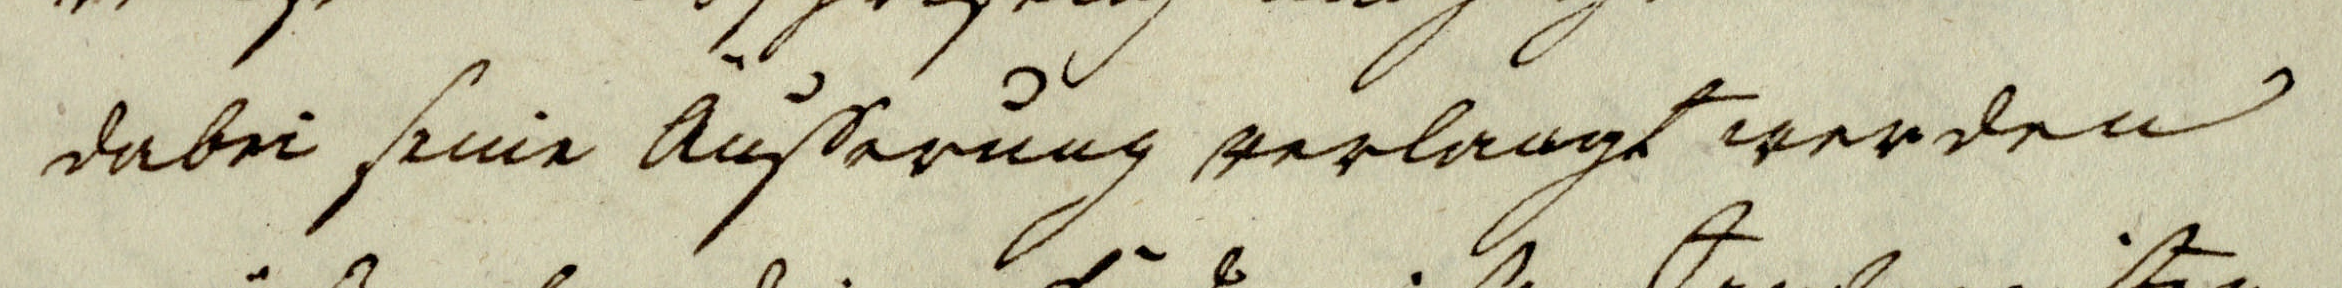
dabei seine Äusserung verlangt werden
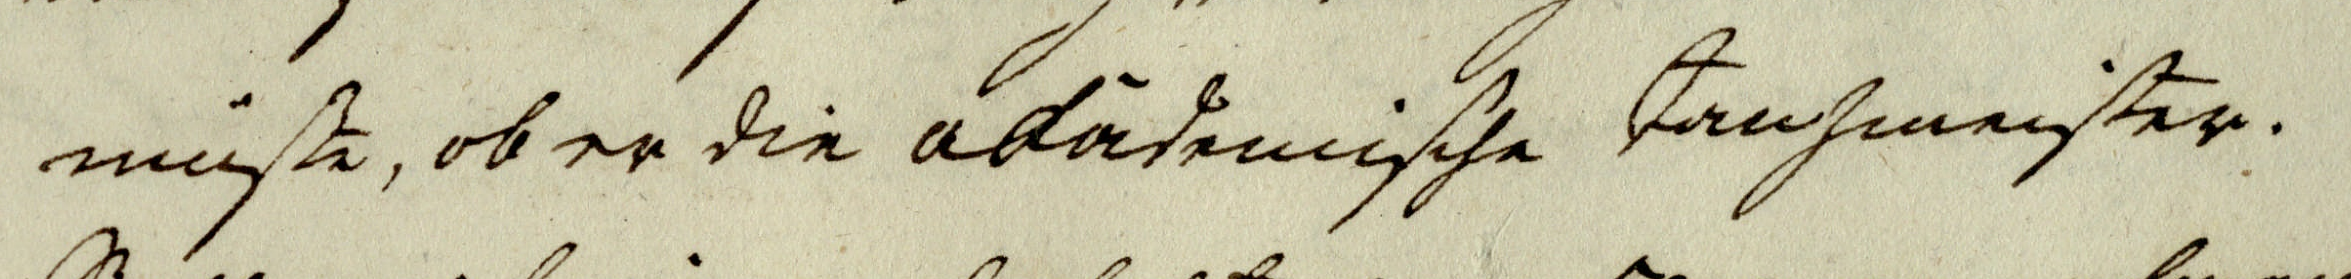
müsste, ob er die akademische Tanzmeister¬
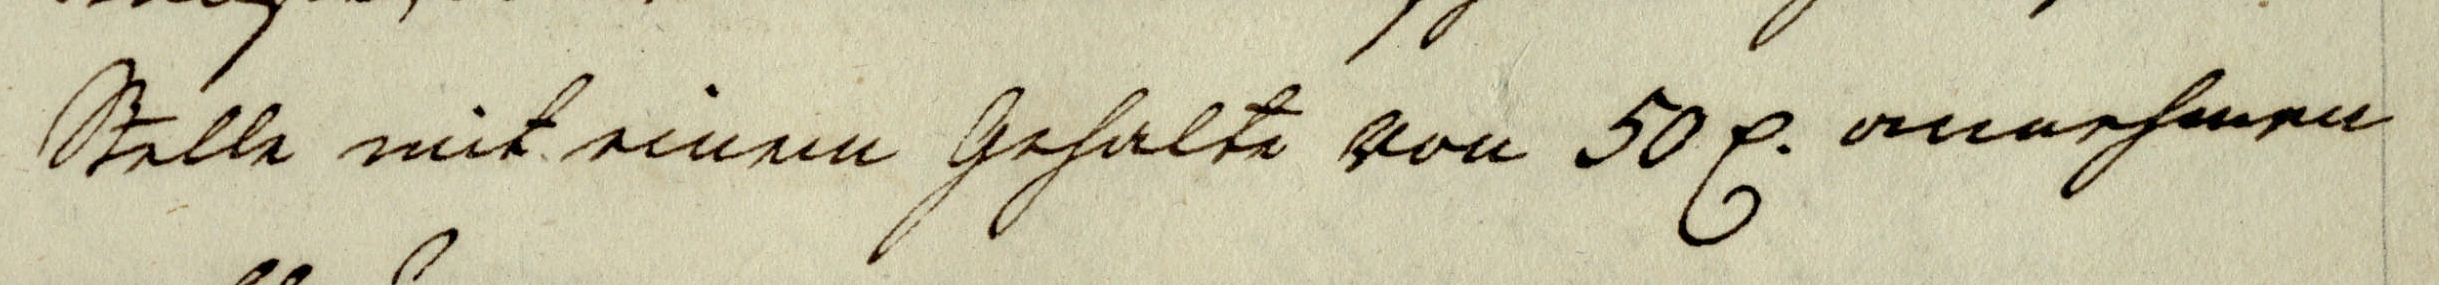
Stelle mit einem Gehalte von 50 l. annehmen
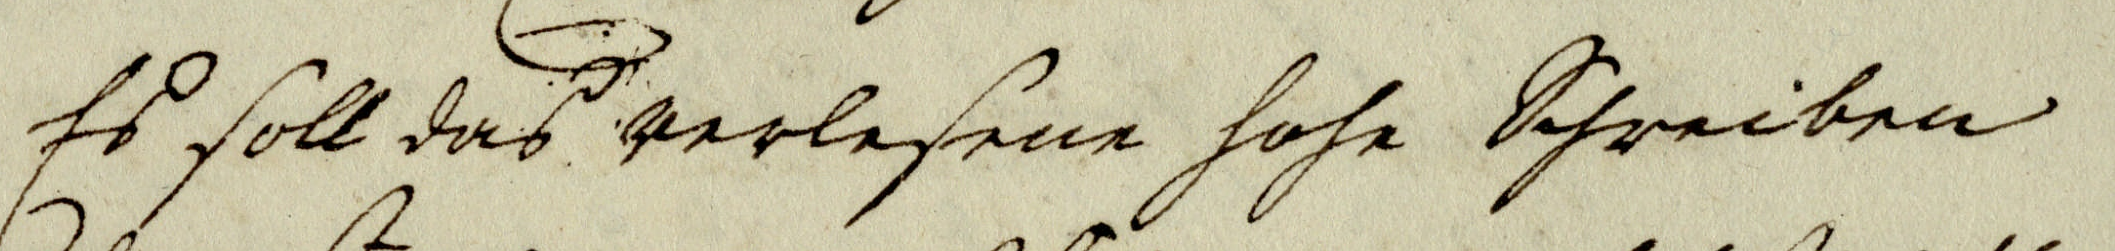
Es soll das verlesene hohe Schreiben
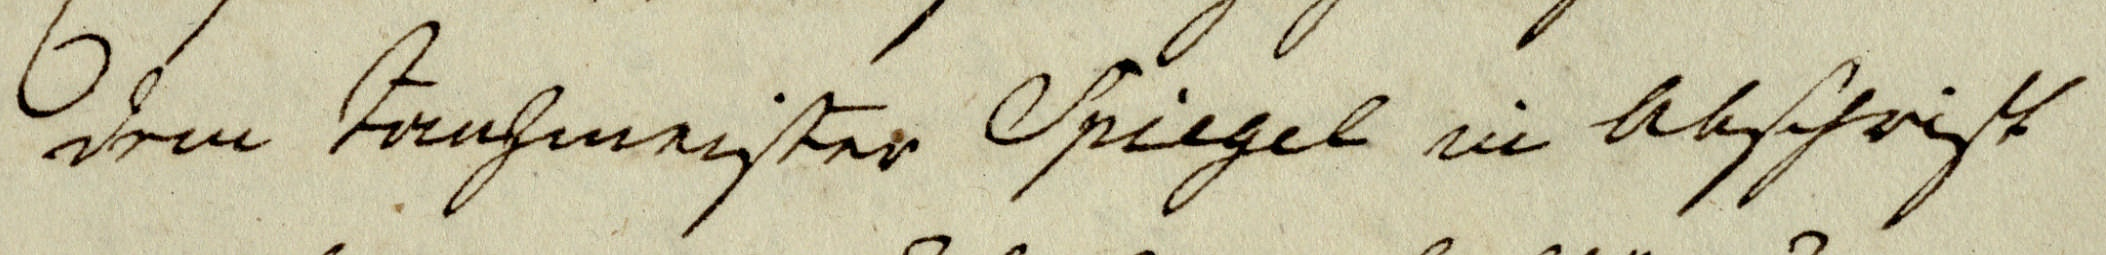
dem Tanzmeister Spiegel in Abschrift
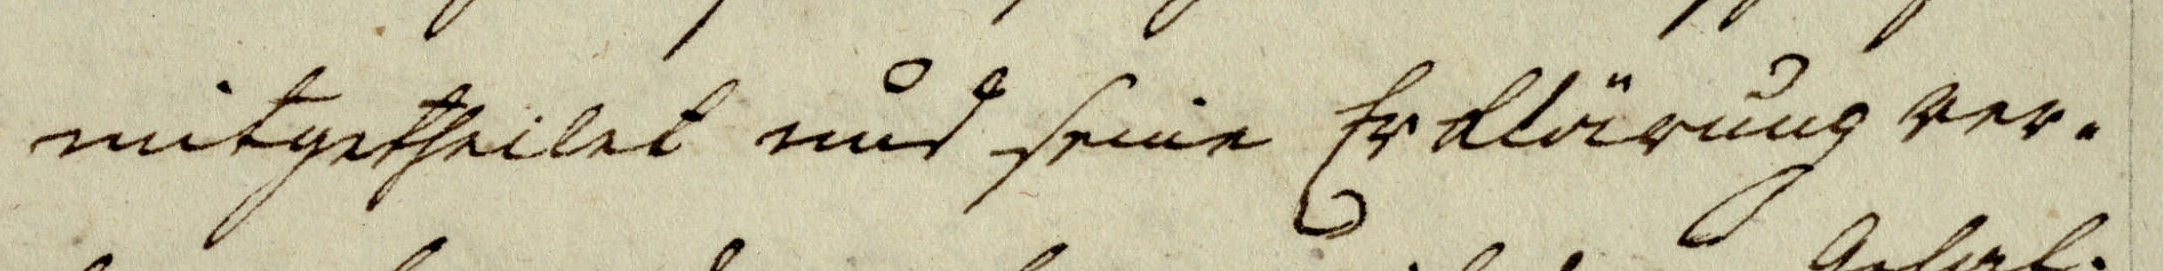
mitgetheilet und seine Erklärung ver¬
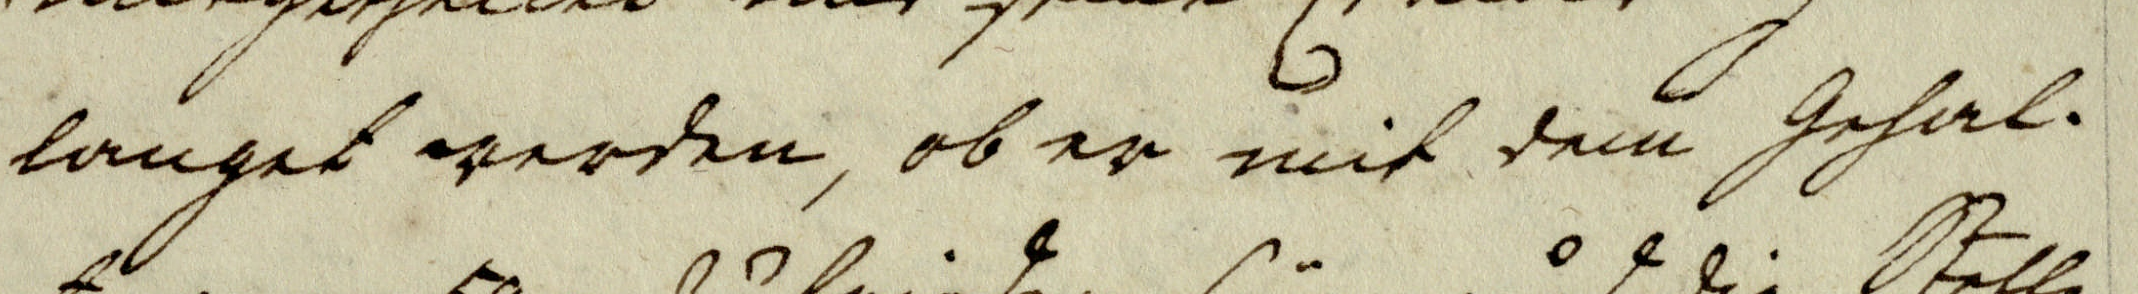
langet werden, ob er mit dem Gehal¬
